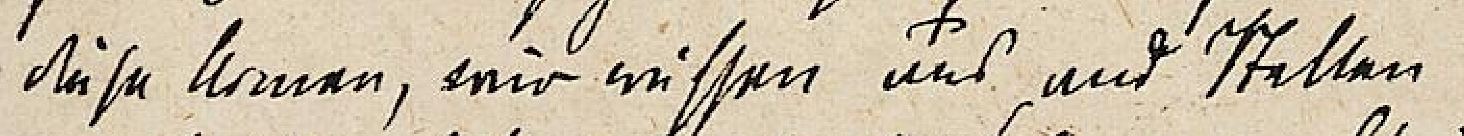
diese Armen, wir müssen uns und Stellen
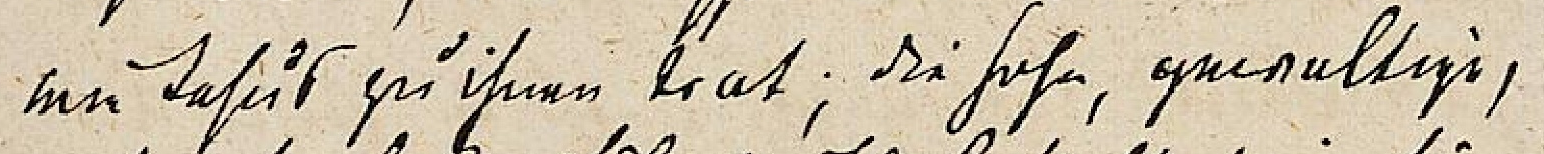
wie Jesus zu ihnen trat, die Hohe, gewaltige,
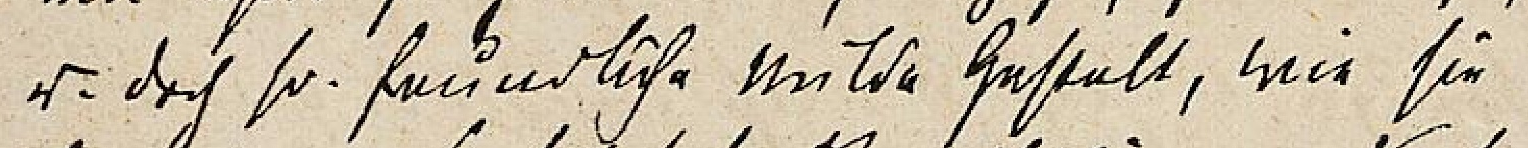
u. doch so freundliche milde Gestalt, wie sie
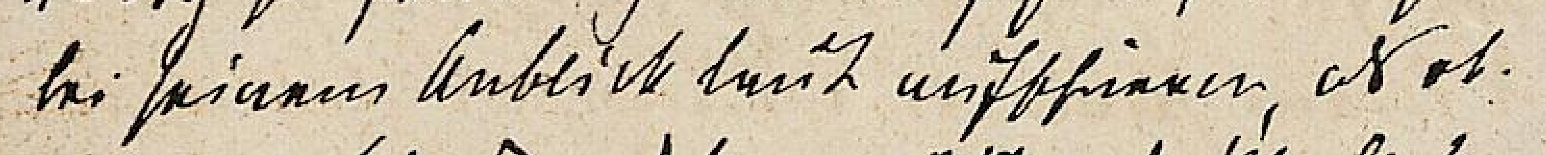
bei seinem Anblick laut auffschrieen, als ob
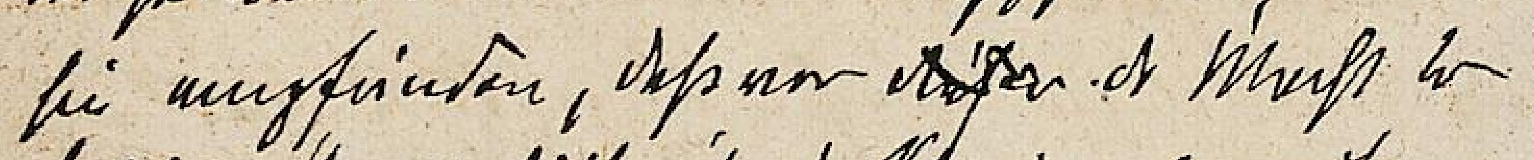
sie empfinden, daß vor dieser dr. Macht 1r
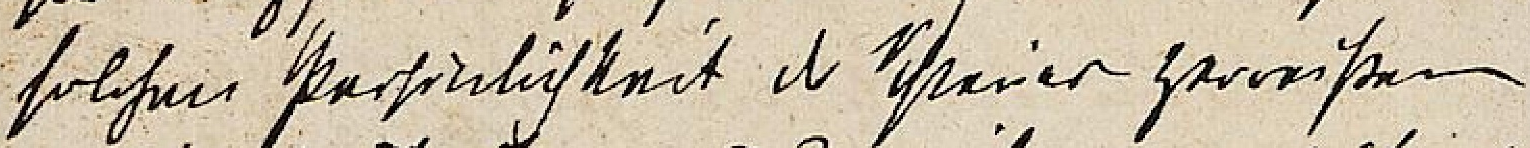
solchen Persönlichkeit dr Schreier zerreißen
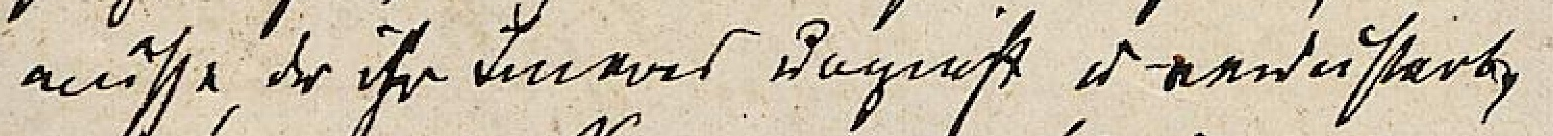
müsse, dr ihr Inneres umzieht u. entdüstert,
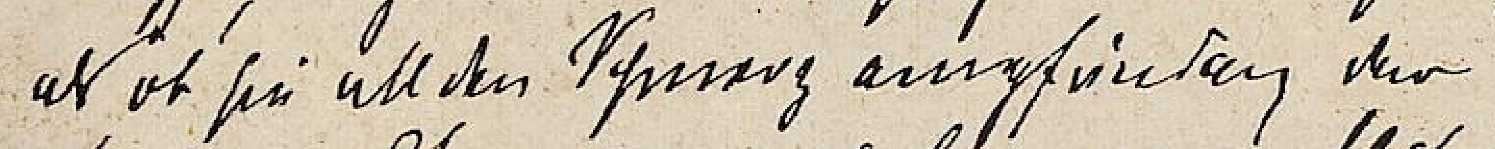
als ob sie all den Schmerz empfinden, der
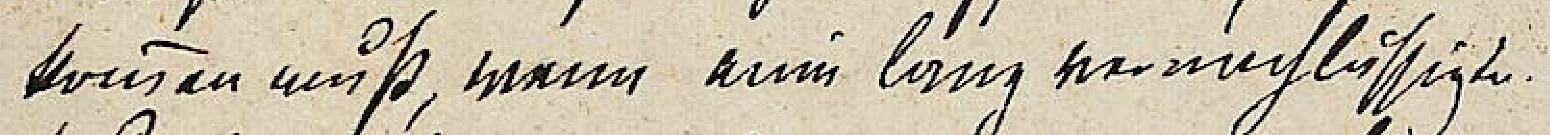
komen muß, wenn eine lang vernachlässigte
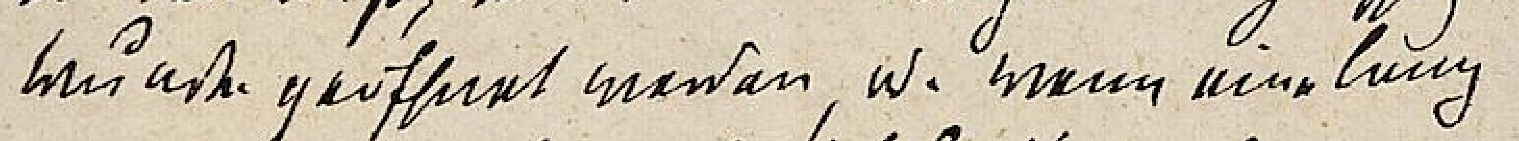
Wunde geöffnet werden, u. wenn eine lang
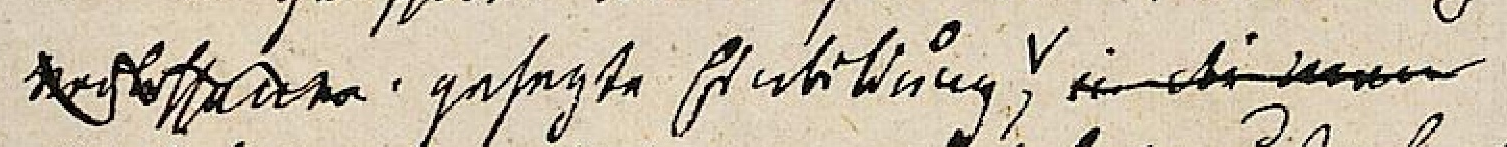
verschlossene. gesagte Einbildung, in die von
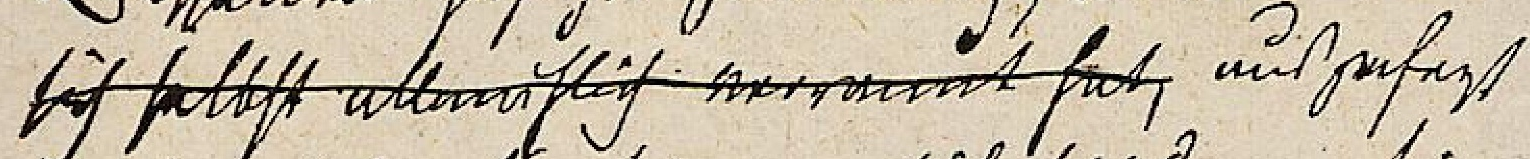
sich selbst allmählich verrannt hat, ausgesagt
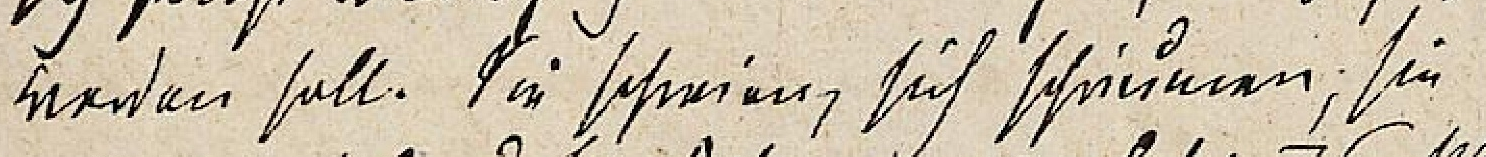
werden soll. Sie schrien, sich schäumen, sie
